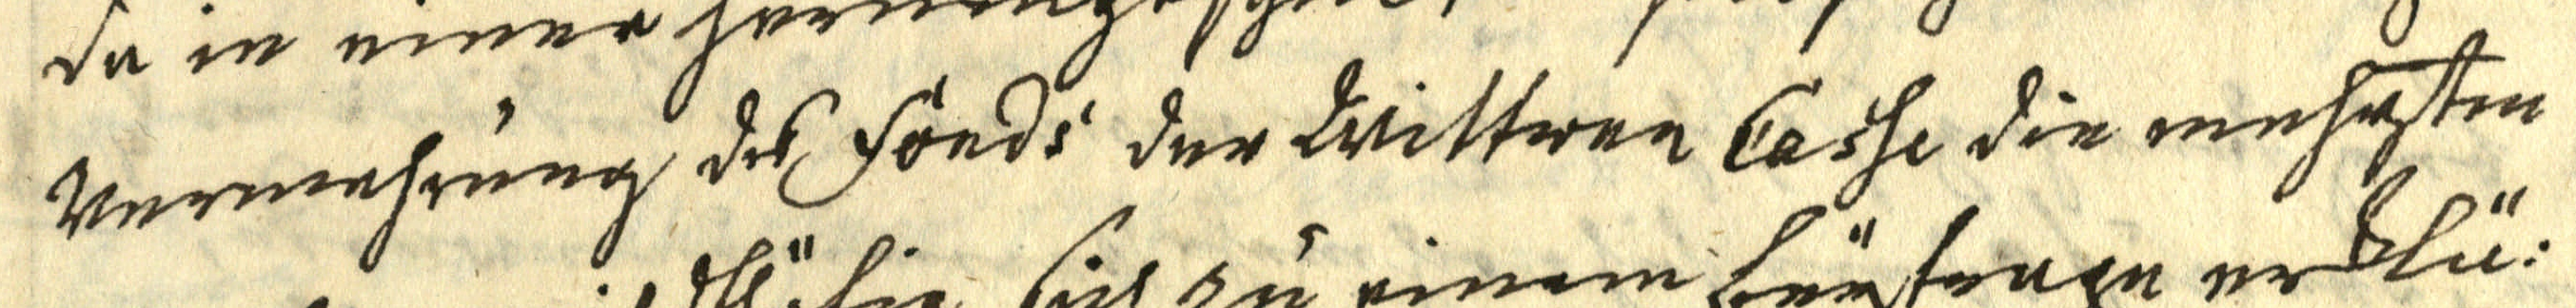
Vermehrung des Fonds der Wittwen Casse die mehrsten
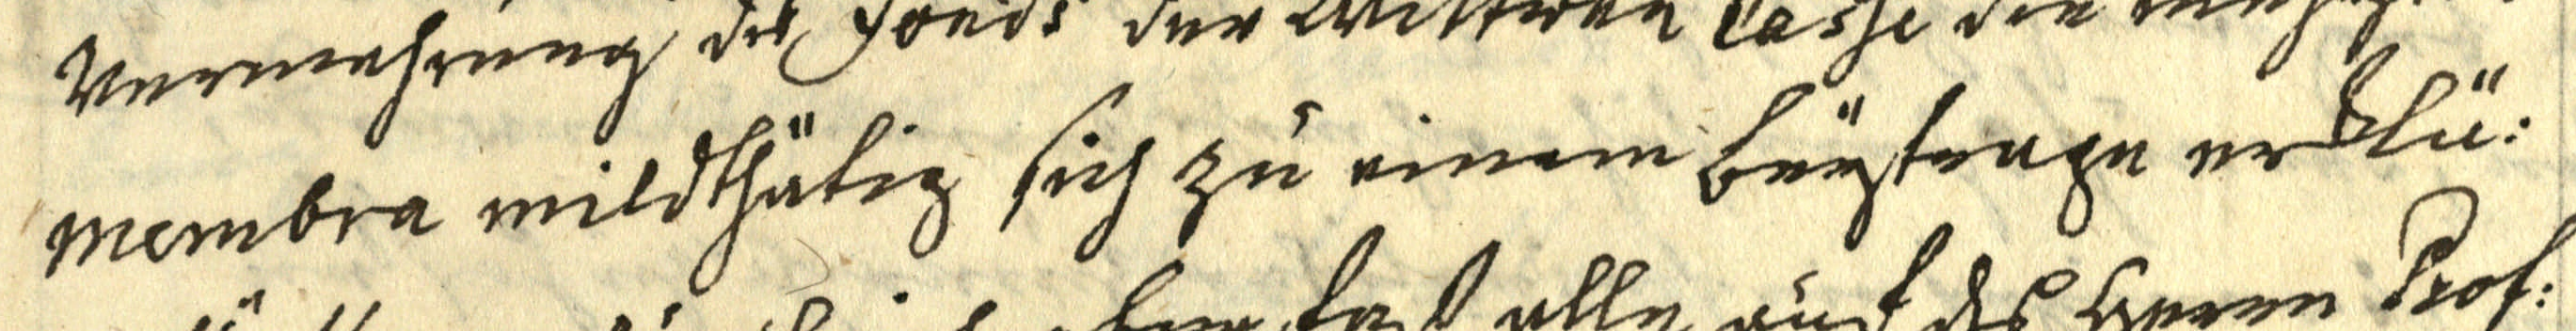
Membra mildthätig sich zu einem Beÿtrage erklä¬
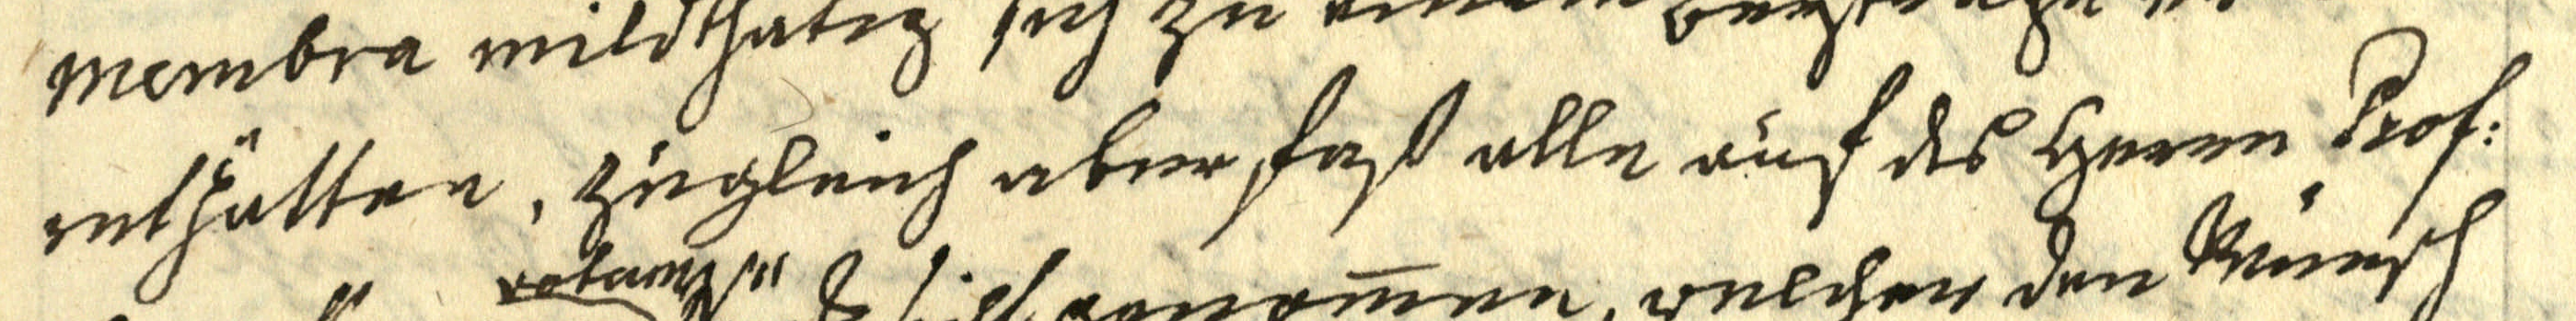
ret hätten, zugleich aber fast alle auf des Herrn Prof.
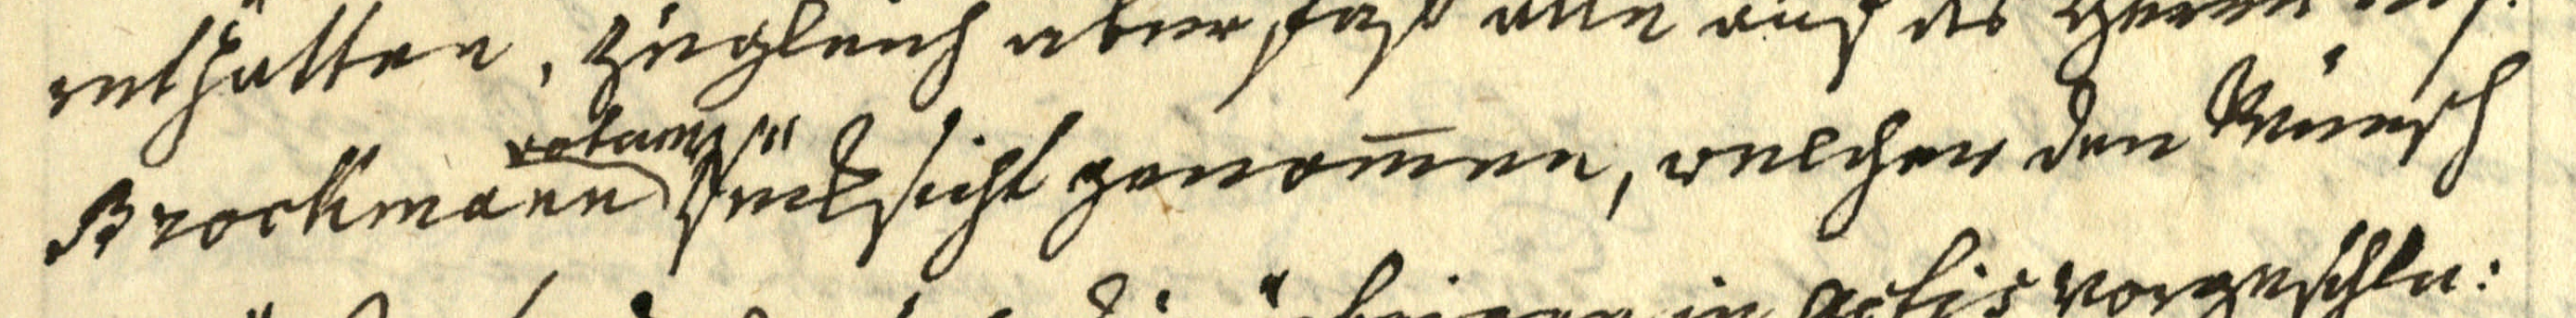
Brockmann votum Rücksicht genomen, welcher den Wunsch
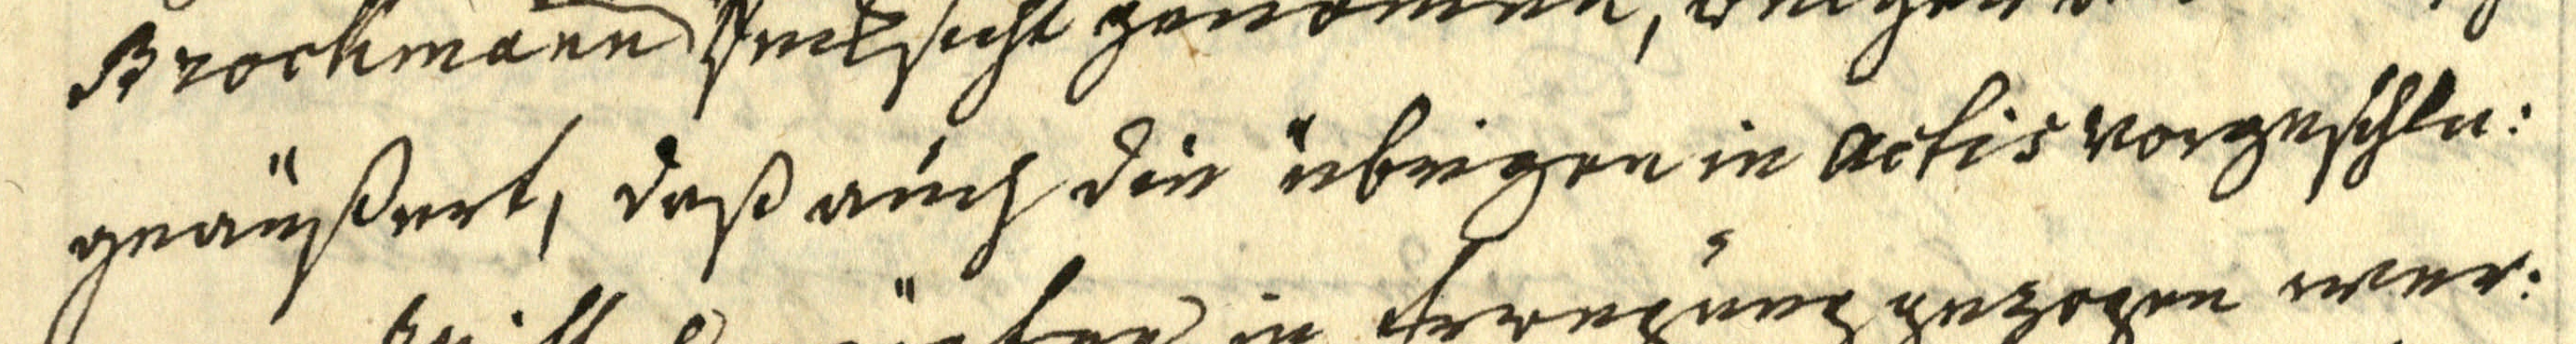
geäußert, daß auch die übrigen in Actis vorgeschla¬
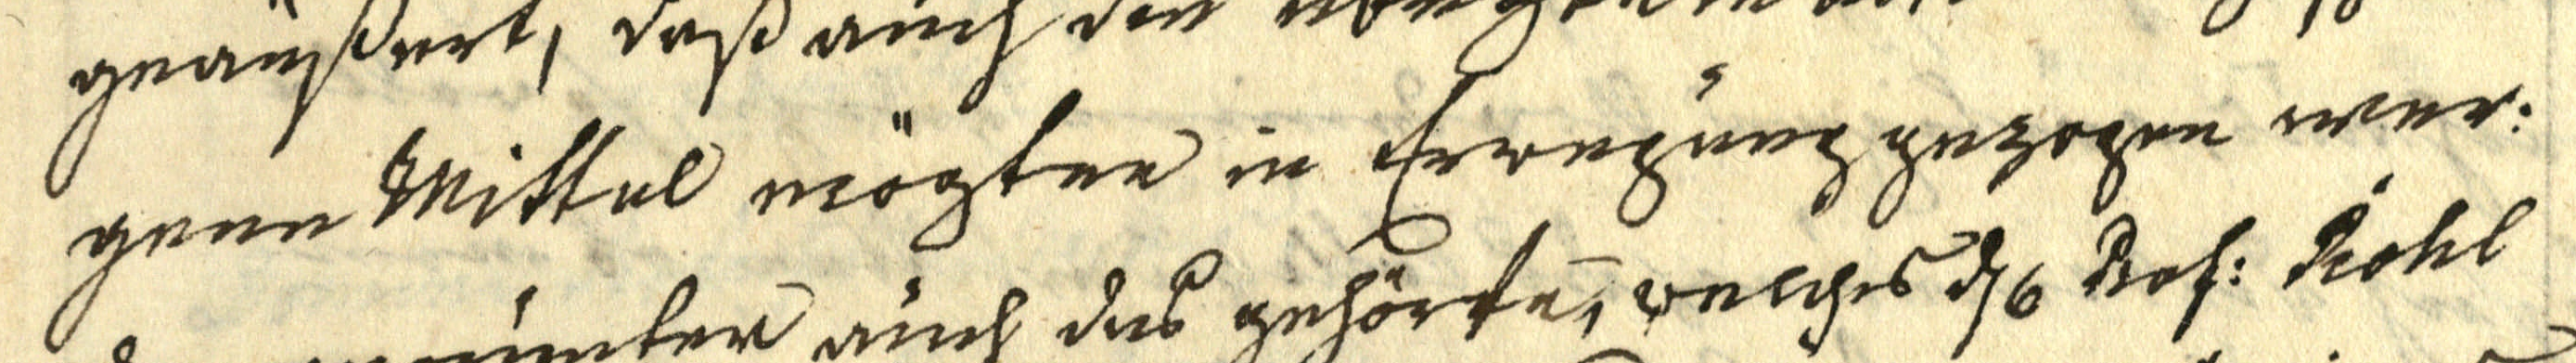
gene Mittel mögten in Erwegung gezogen wer¬
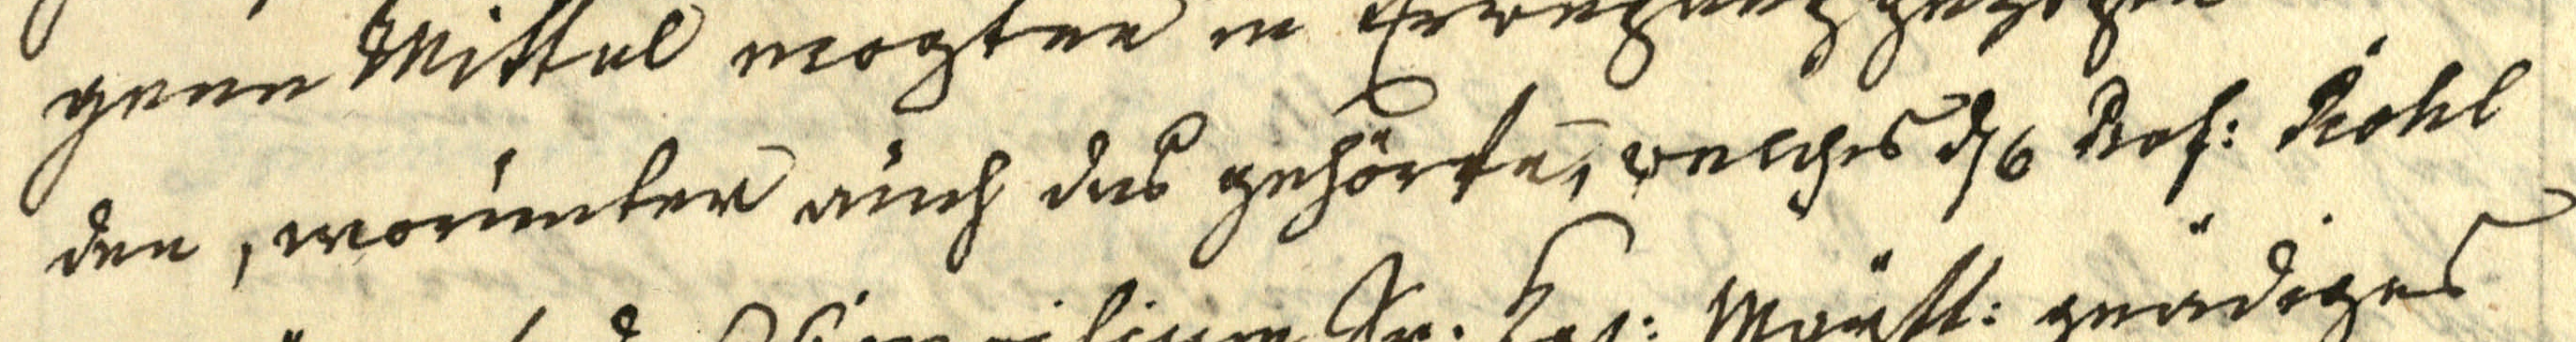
den, worunter auch des gehörte, welches dh Prof. Röhl
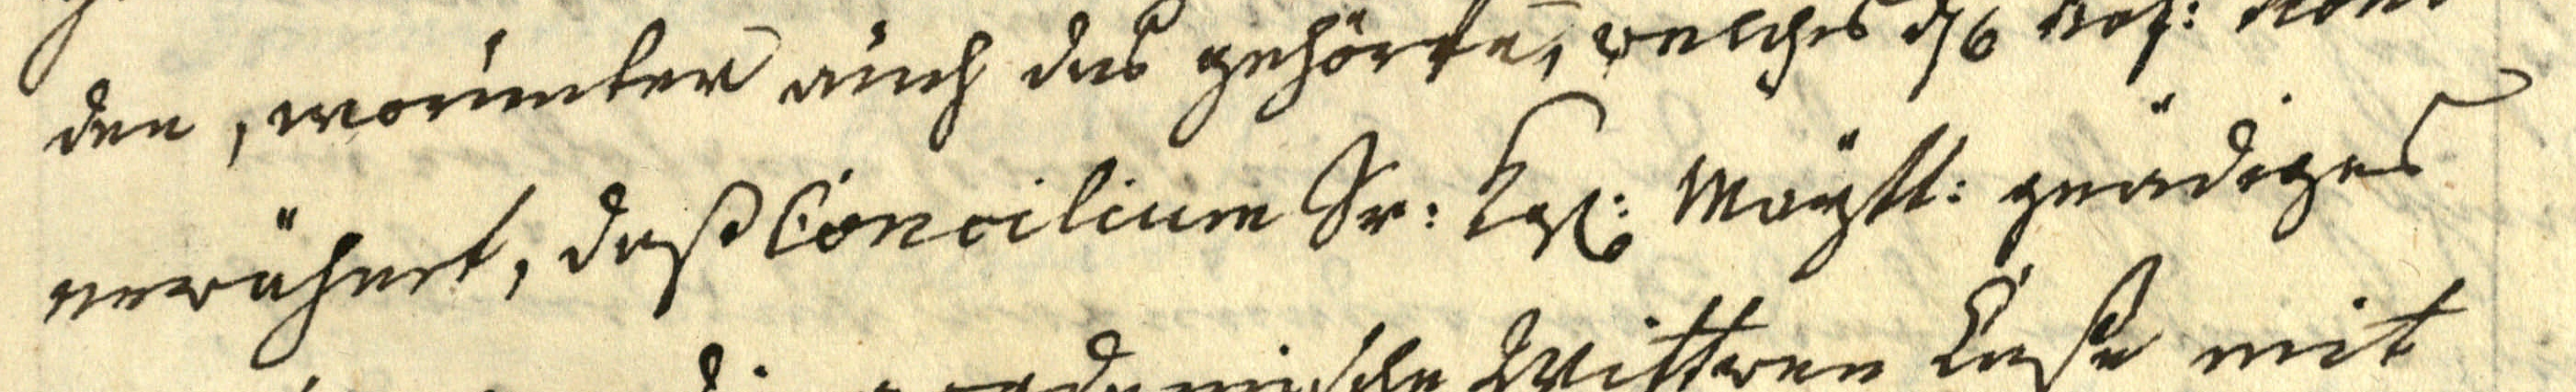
erwähnet, daß Concilium Sr. Kgl. Maÿtt. gnädiges
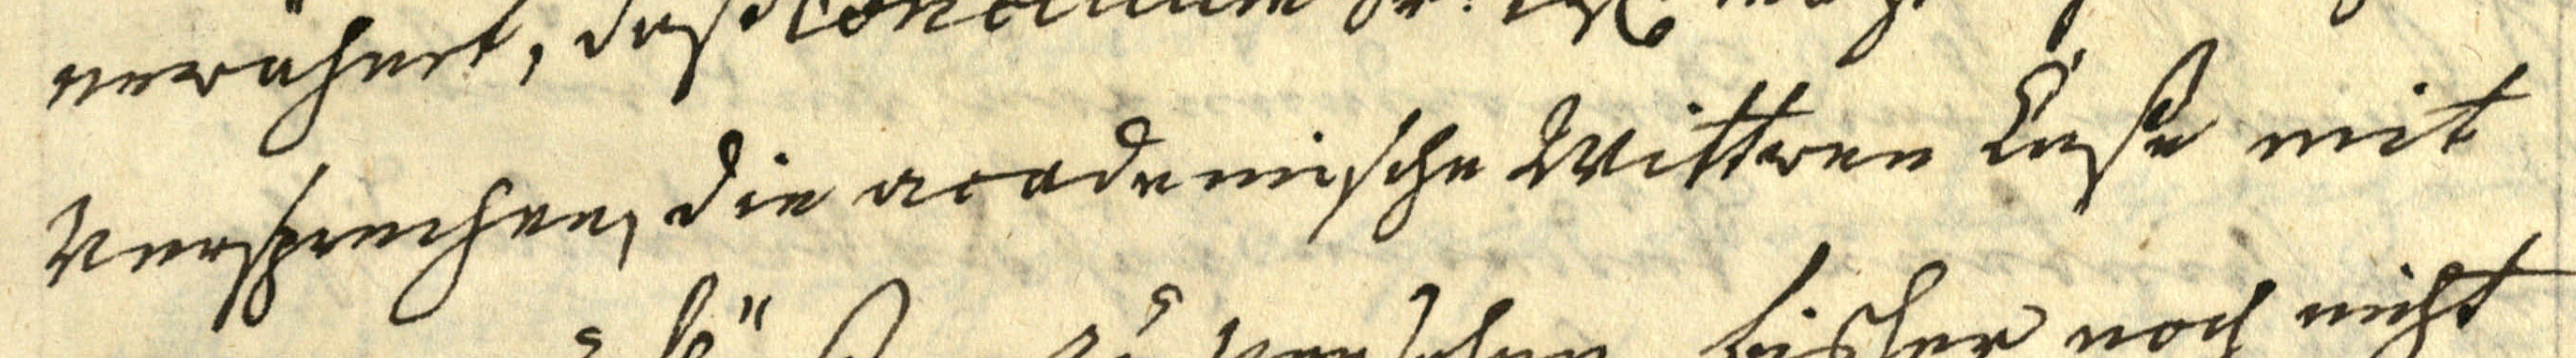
Versprechen, die academische Wittwen Caße mit
